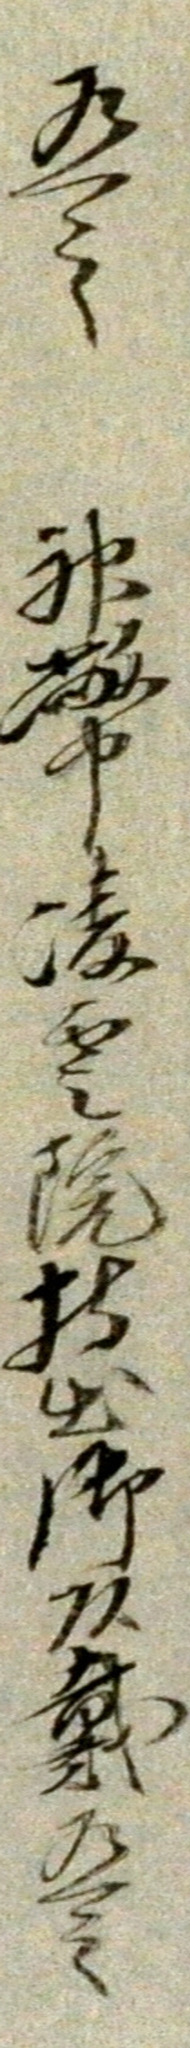有之神幣凌雲院持出御頂戴有之
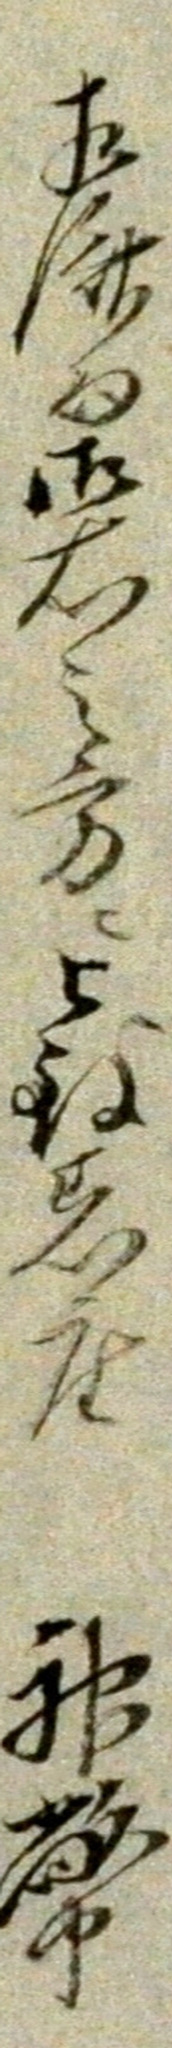相済而御右之方ニ被致着座神幣
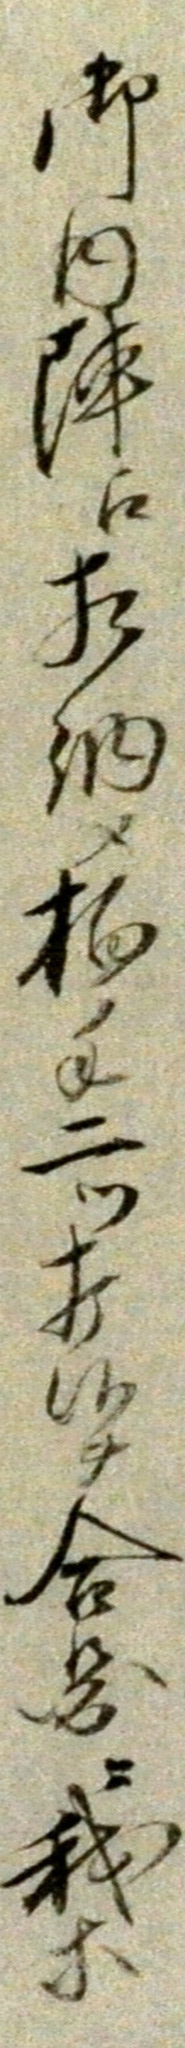御内陣え相納メ柏手二ツ打候ヲ合図ニ我等
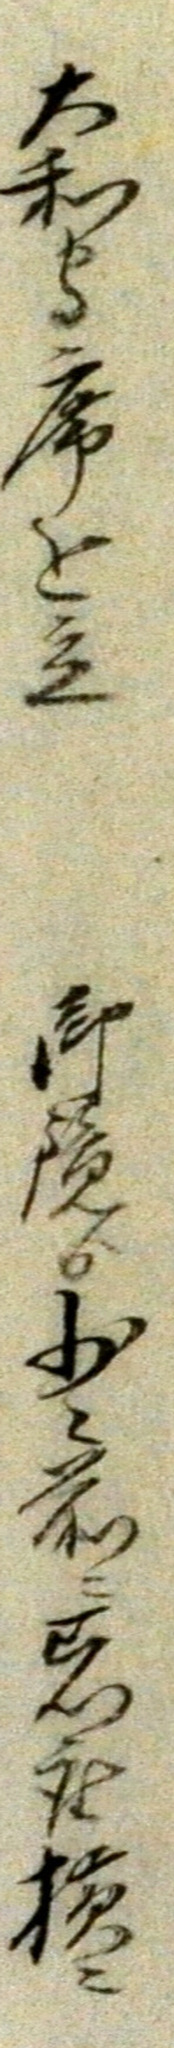大和守席を立御鏡ゟ少々前ニ着座横ニ
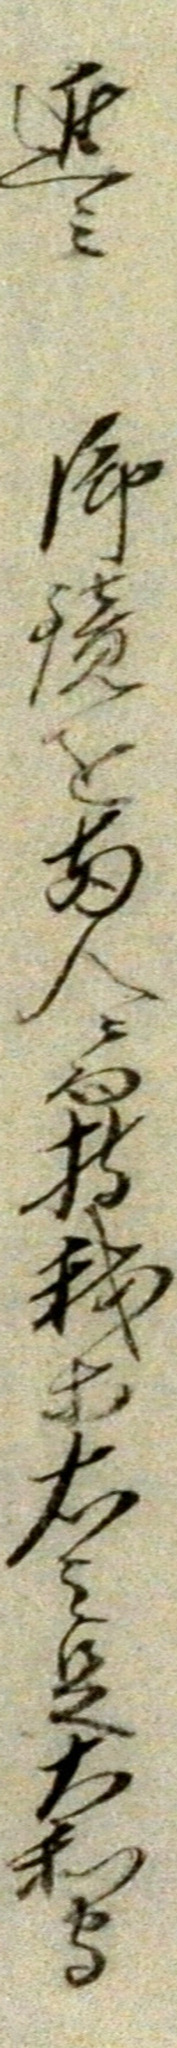進ミ御鏡を両人ニ而持我等右之足大和守
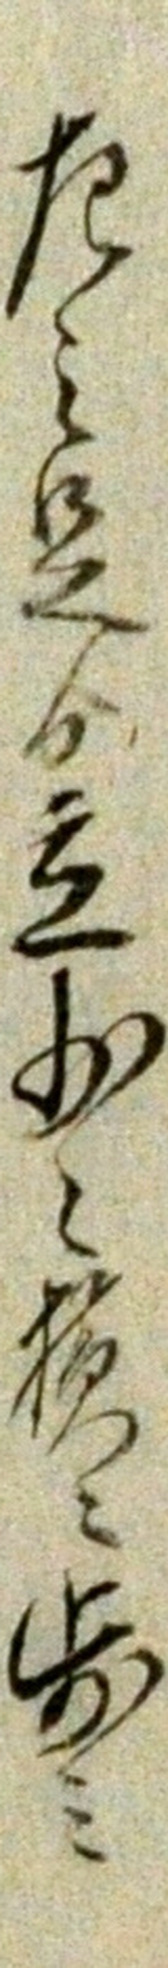左之足ゟ立少々横ニ歩ミ
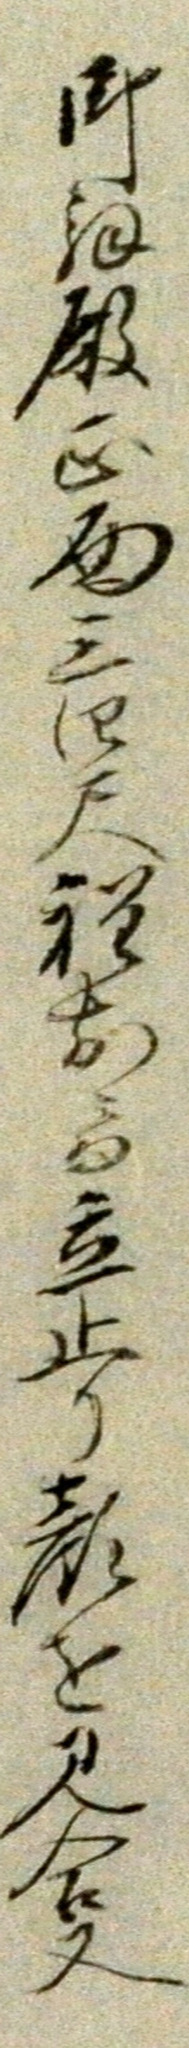御拝殿正面三四尺程前ニ而立止り顔を見合又
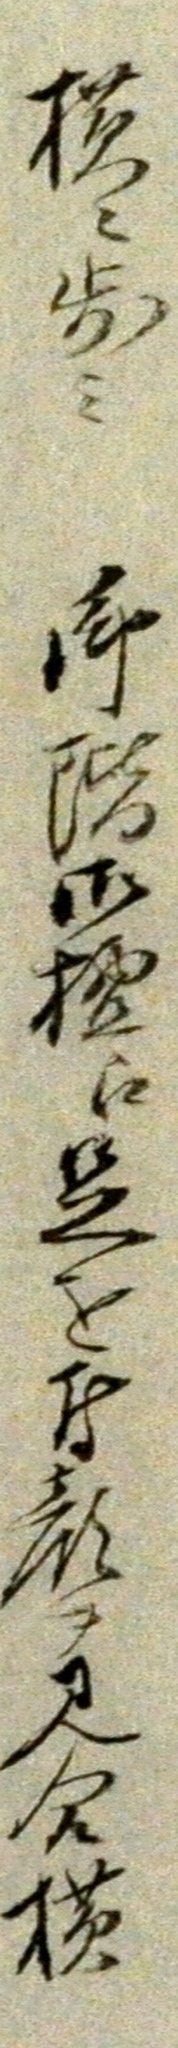横ニ歩ミ御階御壇え足を付顔ヲ見合横
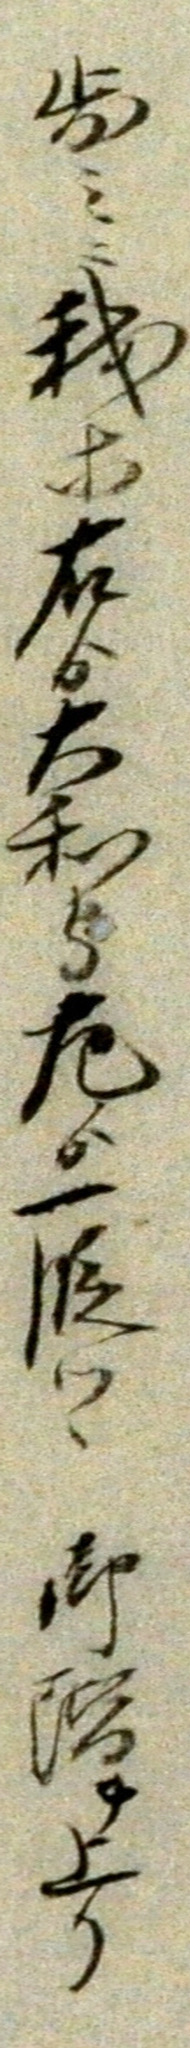歩ミニ我等右ゟ大和守左ゟ一段ツヽ御階ヲ上り
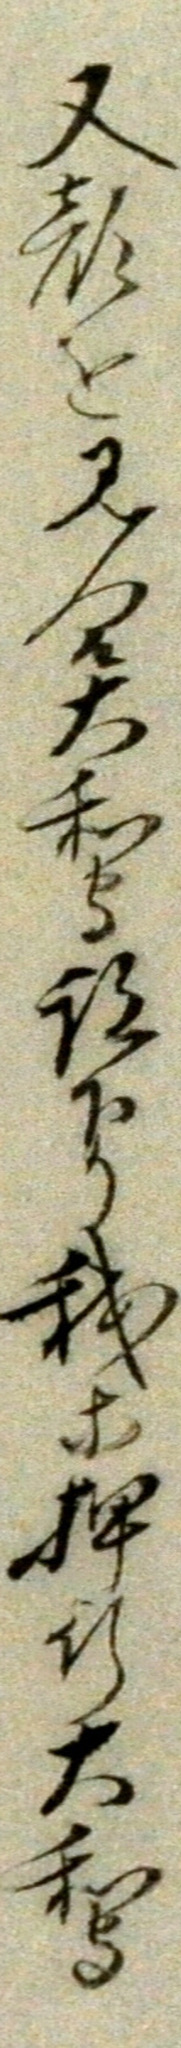又顔を見合大和守跡下り我等押行大和守

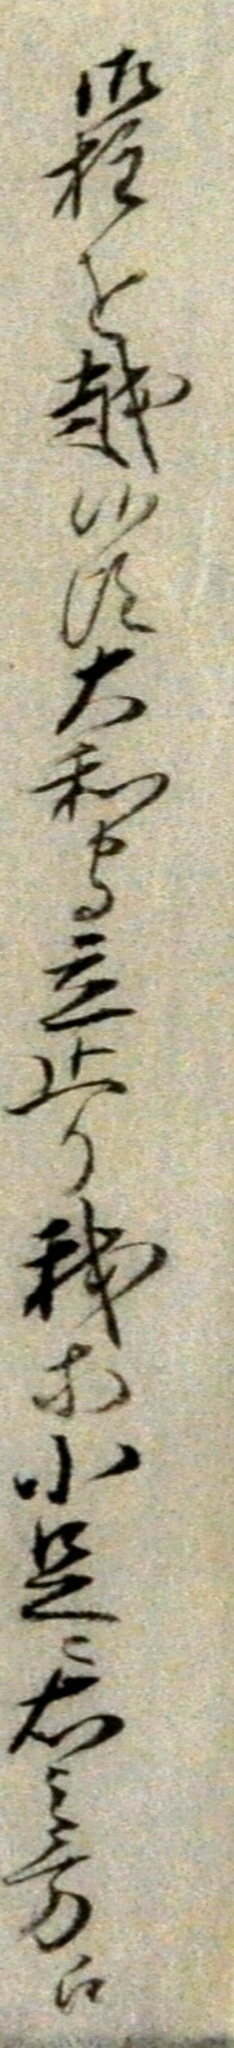御柱を越候頃大和守立止り我等小足ニ右之方え
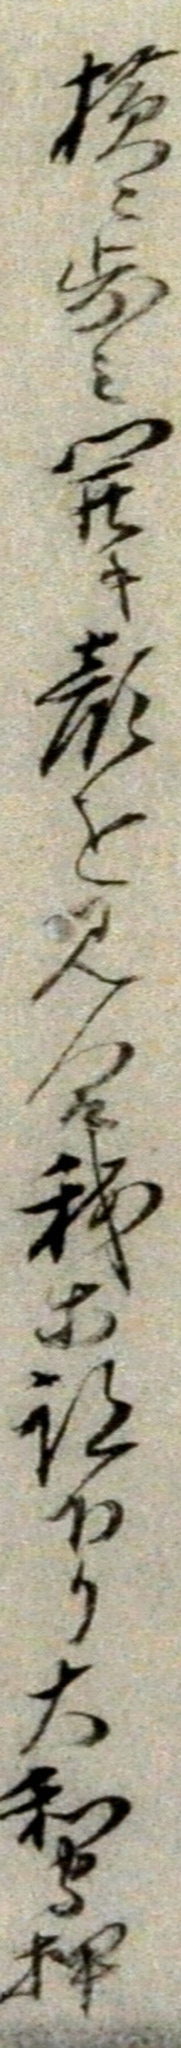横ニ歩ミ開キ顔を見合我等跡下り大和守押
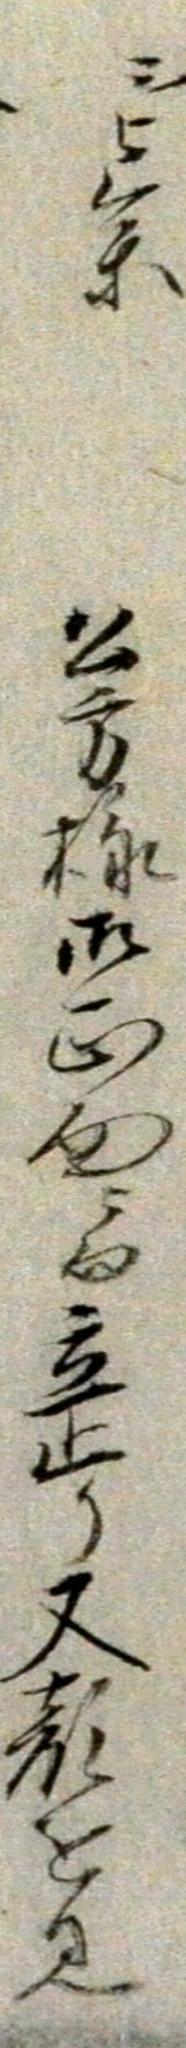シ被参公方様御正面ニ而立止り又顔を見
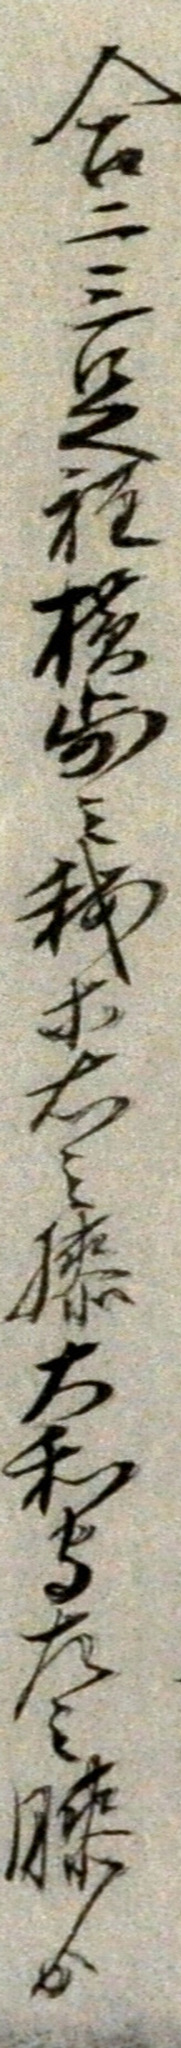合二三足程横歩ミ我等右之膝大和守左之膝ゟ
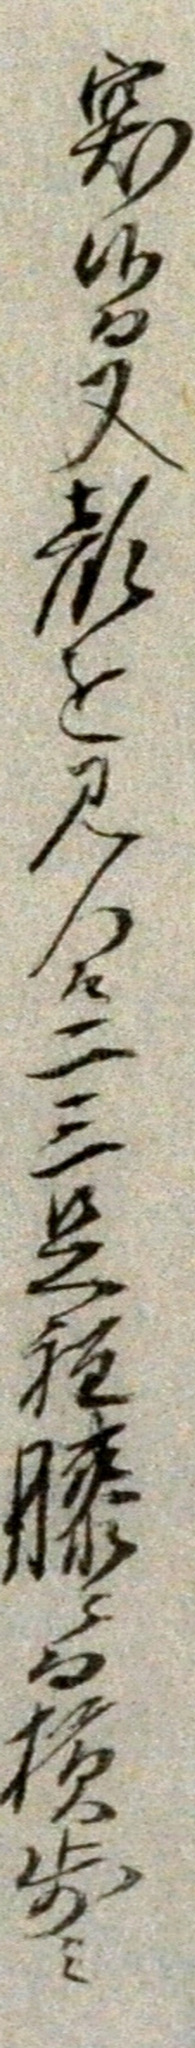突候而又顔を見合二三足程膝ニ而横歩ミ
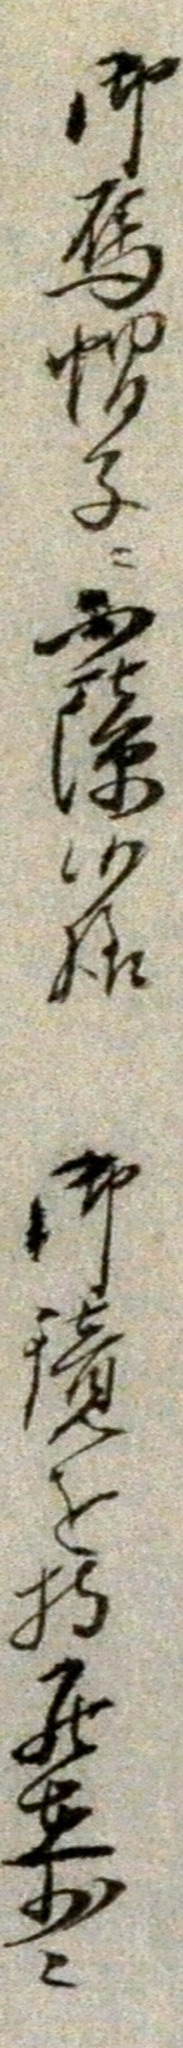御烏帽子ニ不障候様御鏡を持罷在少々
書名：御鏡餅御用留（写）
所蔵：伊那市立高遠町図書館・合同会社AMANE
